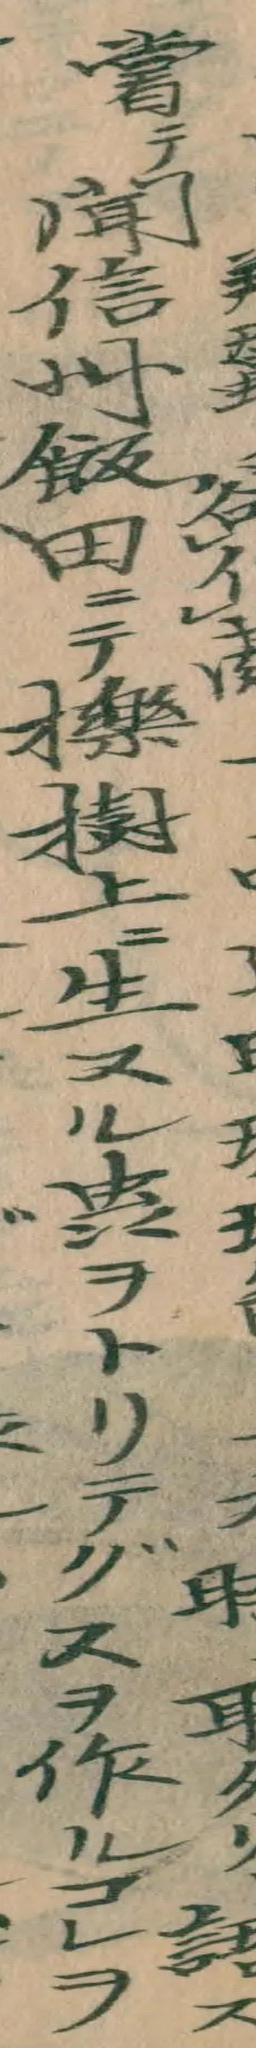嘗テ聞信州飯田ニテ櫟樹上ニ生スル蟲ヲトリテグスヲ作ルコレヲ
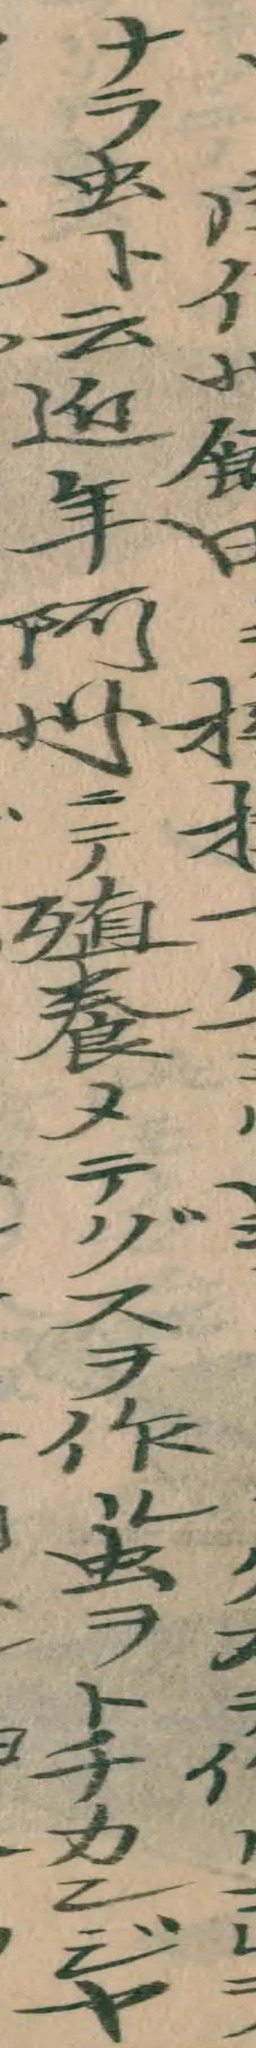ナラ虫ト云近年阿州ニテ殖養シテテグスヲ作ル虫ヲトチカンジヤ
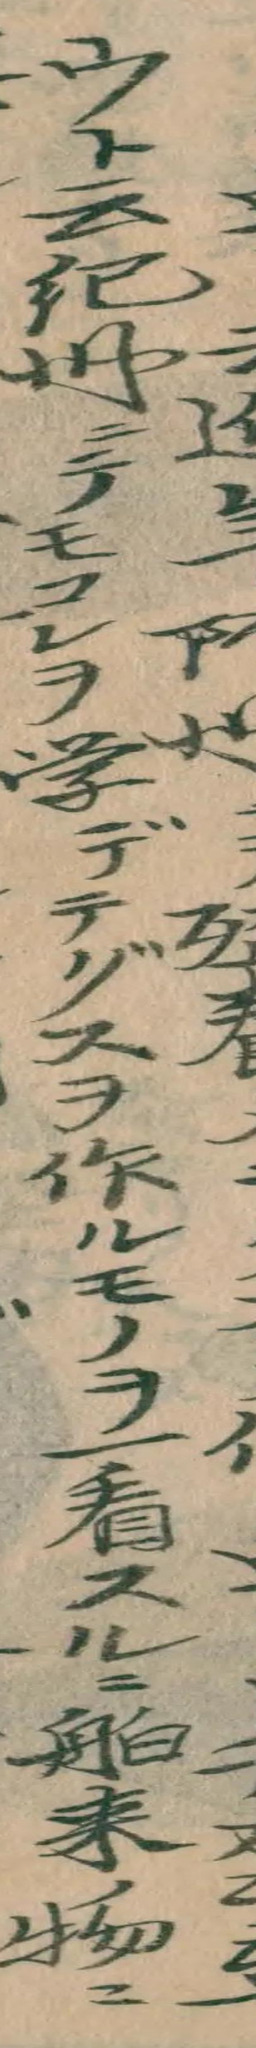ウト云紀州ニテモコレヲ学デテグスヲ作ルモノヲ一看スルニ舶来ノ物ニ
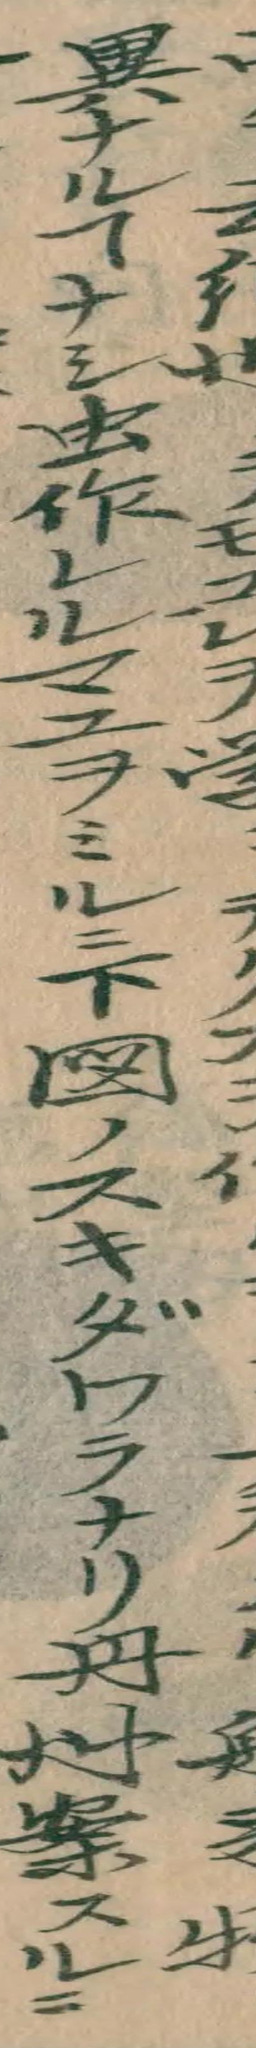異ナルコトナシ虫作レルマユヲミルニ下図ノスキダワラナリ丹州案スルニ
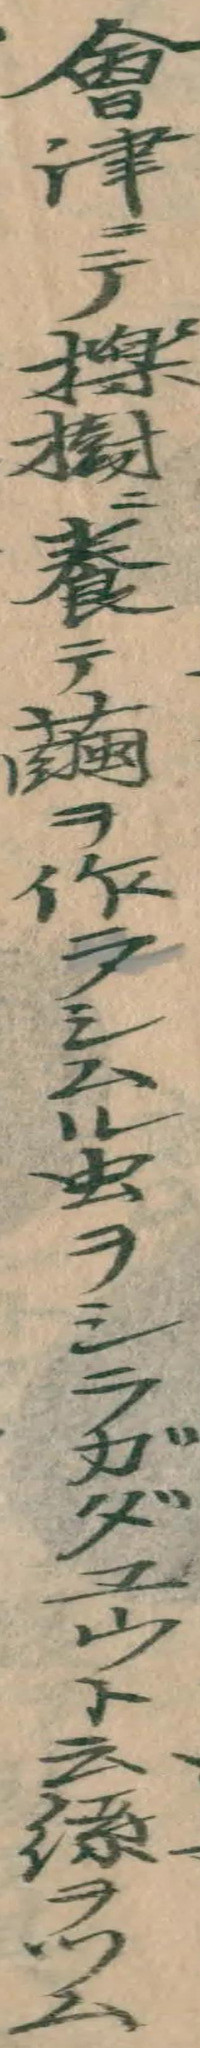會津ニテ櫟樹ニ養テ繭ヲ作ラシムル虫ヲシラガダユウト云絲ヲツム
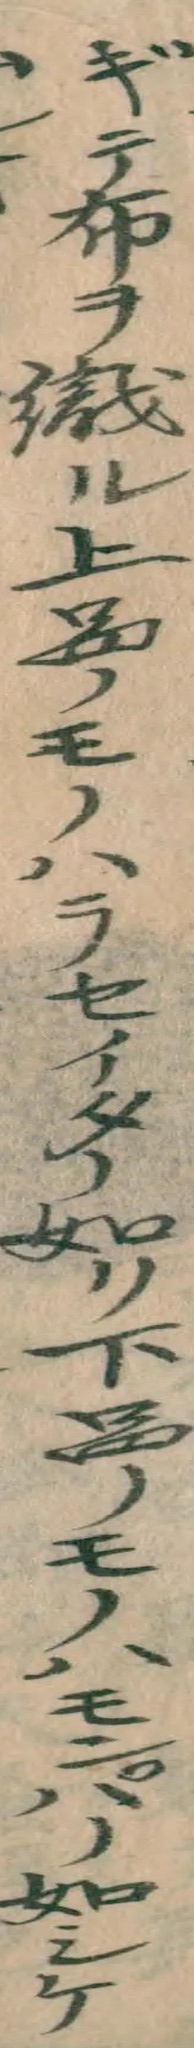ギテ布ヲ織ル上品ノモノハラセイタノ如ク下品ノモノハモンパノ如シケ
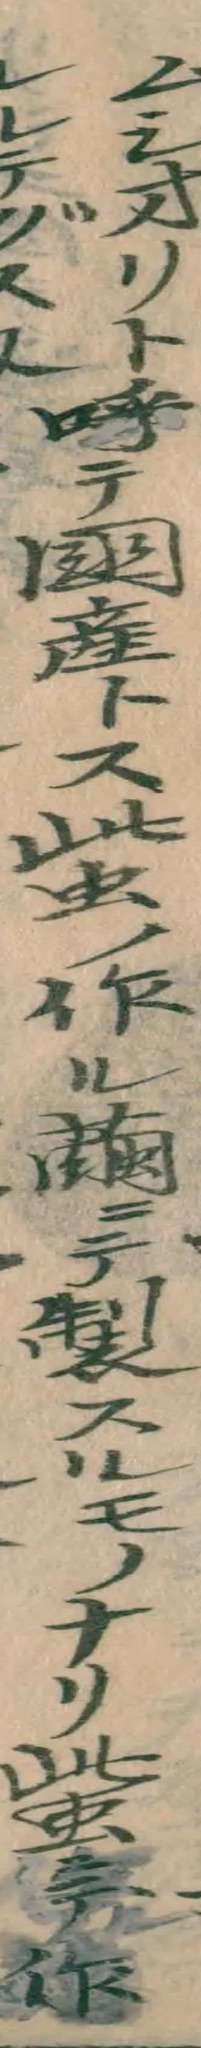ムシオリト呼テ國産トス此虫ノ作ル繭ニテ製スルモノナリ此虫ニテ作
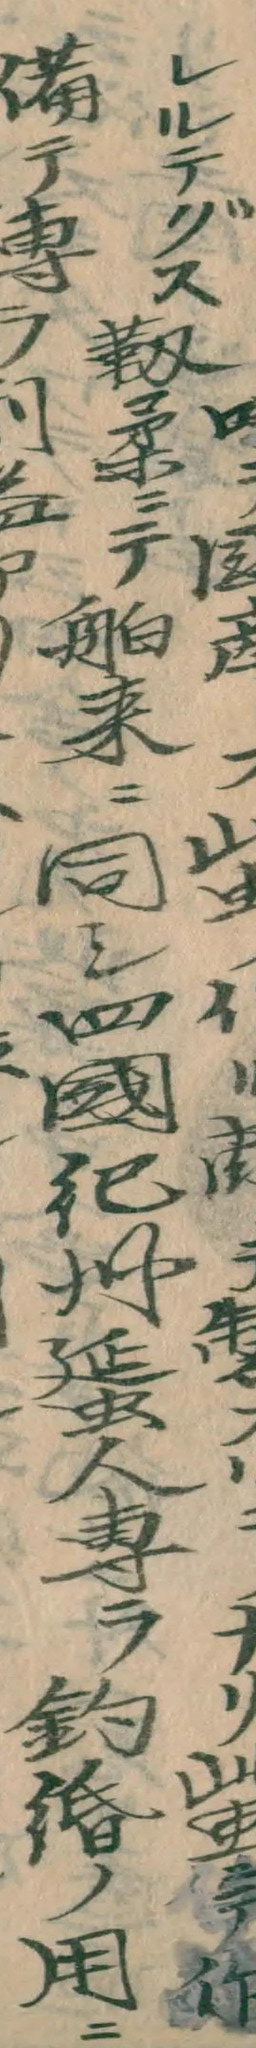レルテグス靱柔ニテ舶来ニ同シ四國紀州蜑人専ラ釣緍ノ用ニ
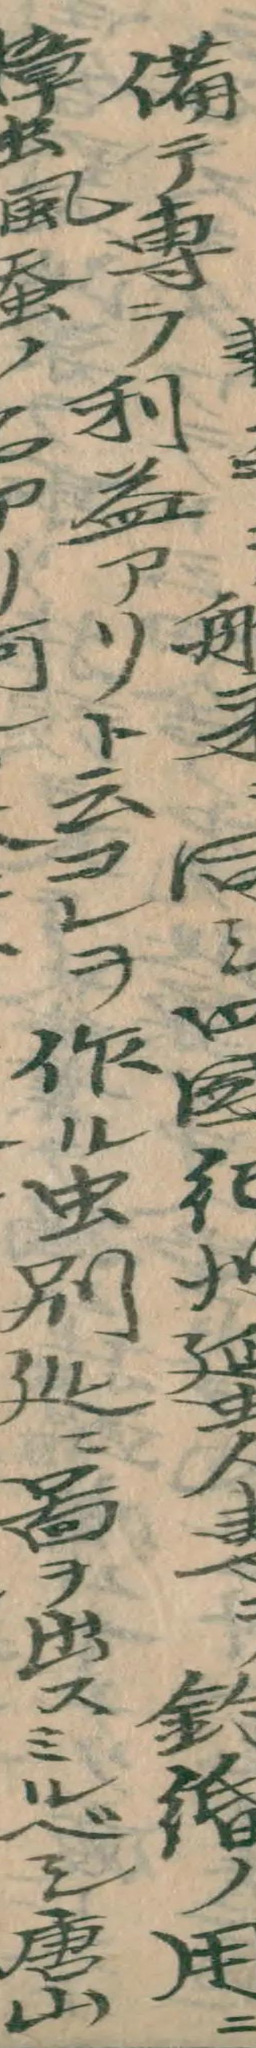備テ専ラ利益アリト云コレヲ作ル虫別処ニ啚ヲ出スミルベシ唐山
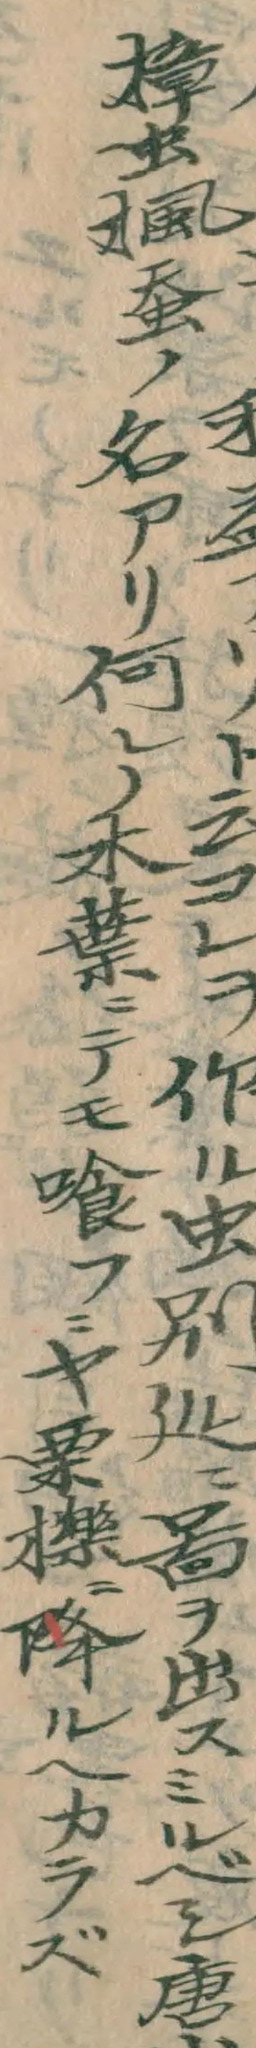樟虫楓蚕ノ名アリ何レノ木葉ニテモ喰フニヤ栗櫟ニ降ルヘカラズ

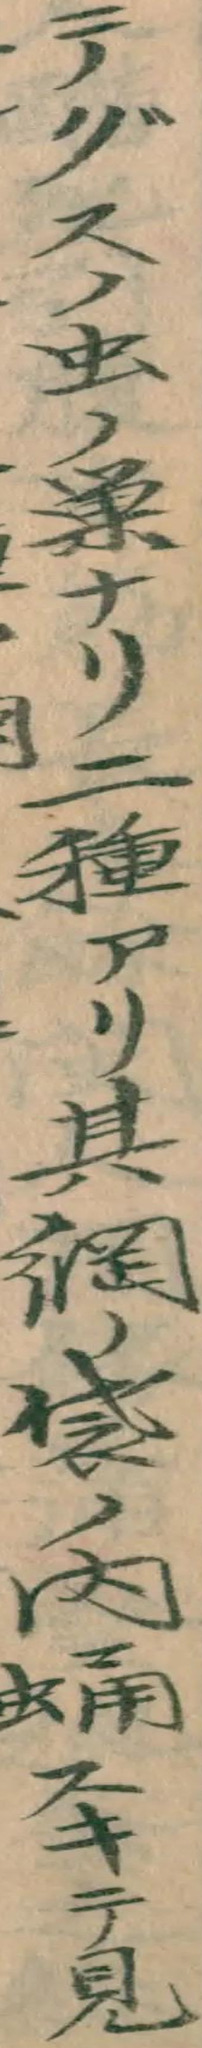楓蚕繭テグスノ虫ノ巣ナリ二種アリ其綱ノ袋ノ内蛹スキテ見
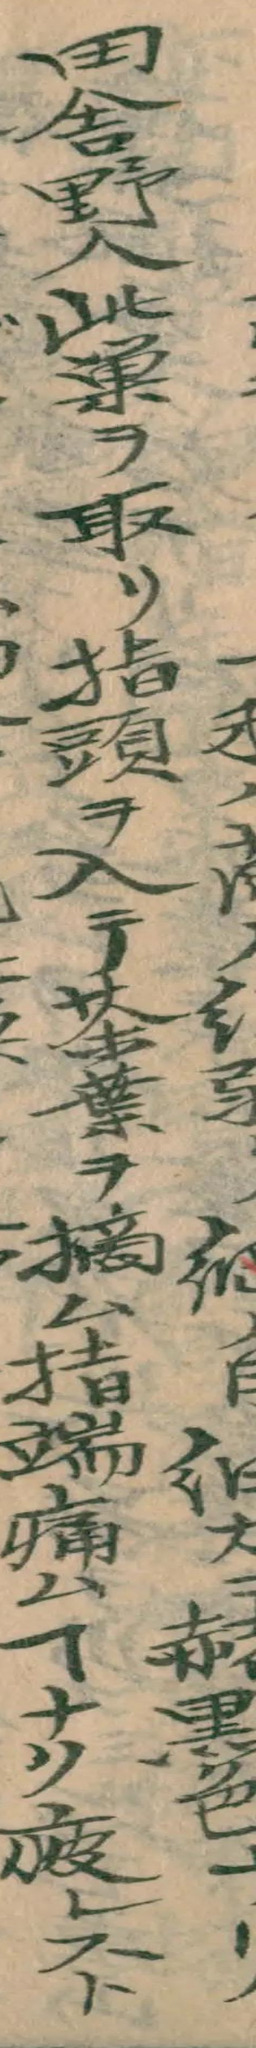田舎野人此巣ヲ取リ指頭ヲ入テ茶葉ヲ摘ム指端痛ムコトナク疲レスト
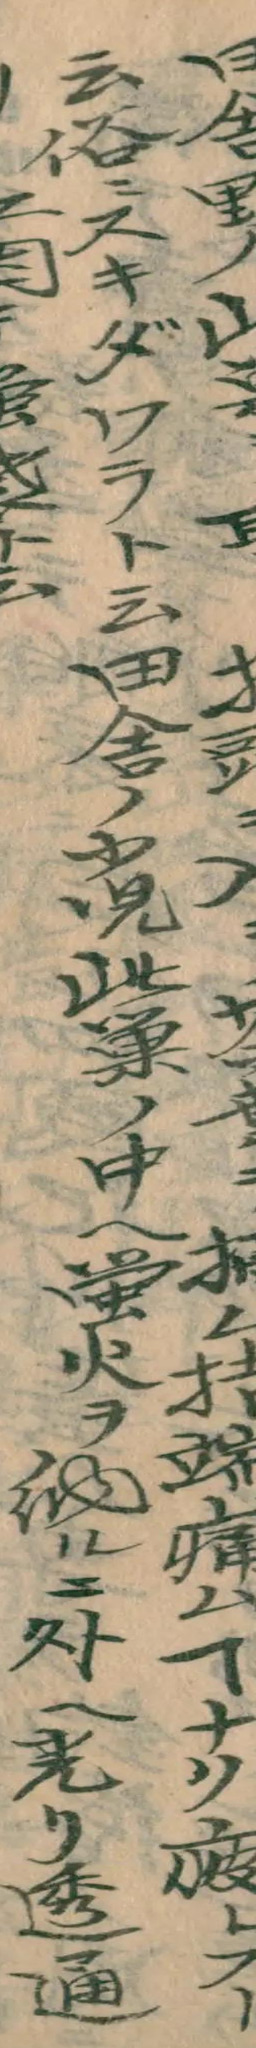云俗ニスキダワラト云田舎ノ小児此巣ノ中ヘ蛍火ヲ納ルニ外ヘ光リ透通
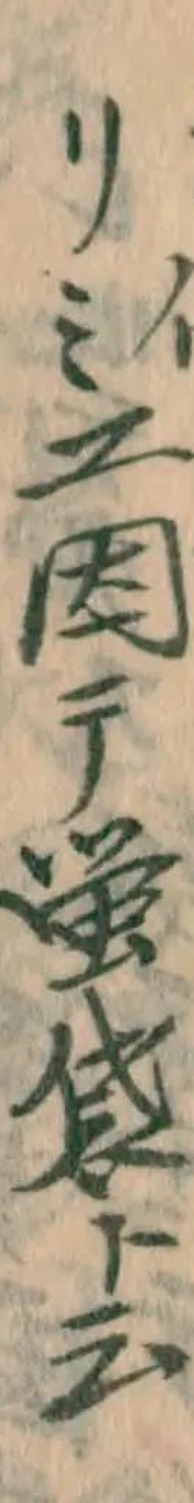リミユ因テ蛍袋ト云
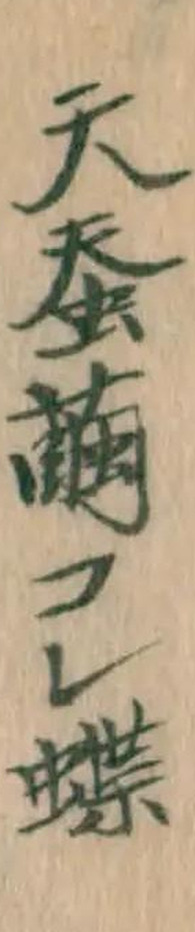天蚕繭コレ蝶
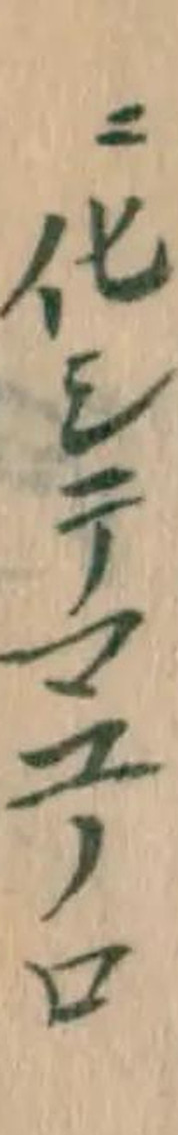ニ化シテマユノ口
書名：千蟲譜 3巻. [1]
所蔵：国立国会図書館 National Diet Library, JAPAN
